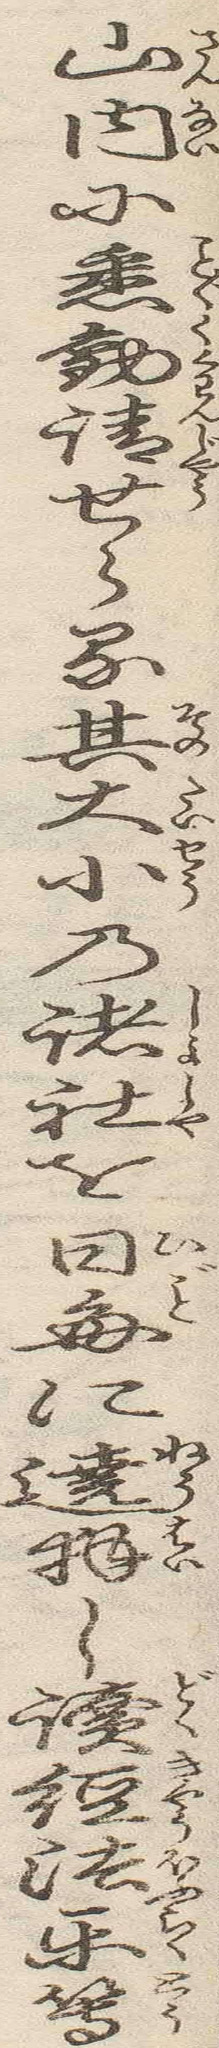山内に悉勸請せらる其大小の諸社を日毎に遶拜し讀經法楽等
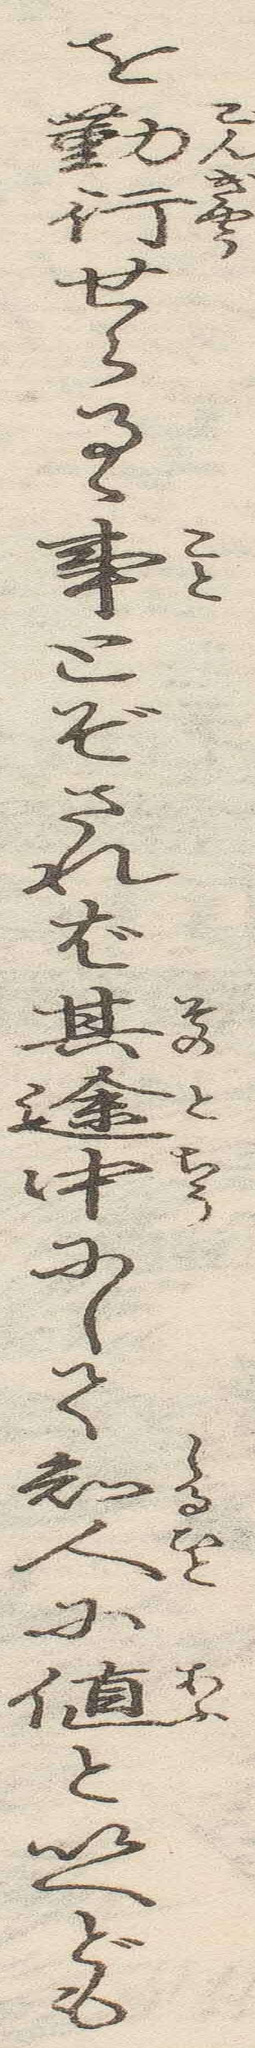を勤行せらるゝ事とぞされば其途中にして知人に値といへども
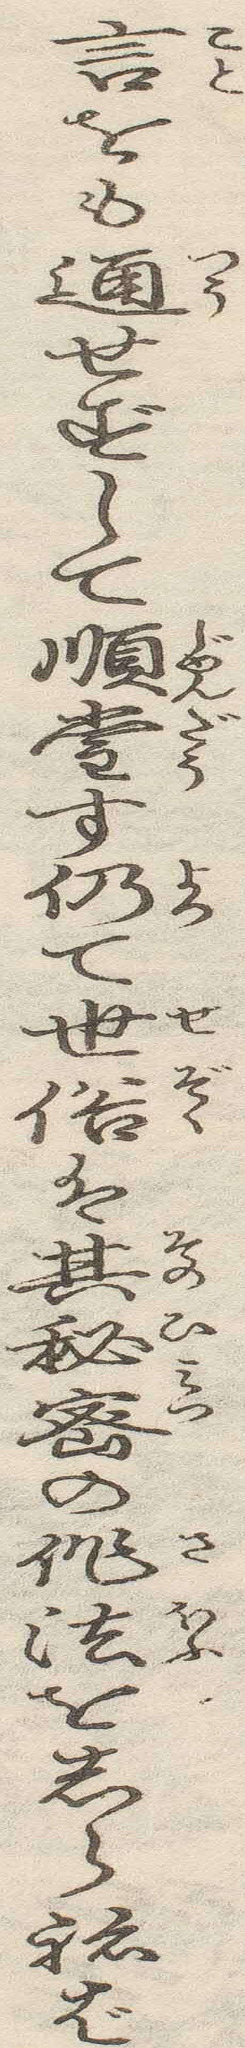言をも通せずして順堂す仍て世俗は其秘密の作法をしらねば
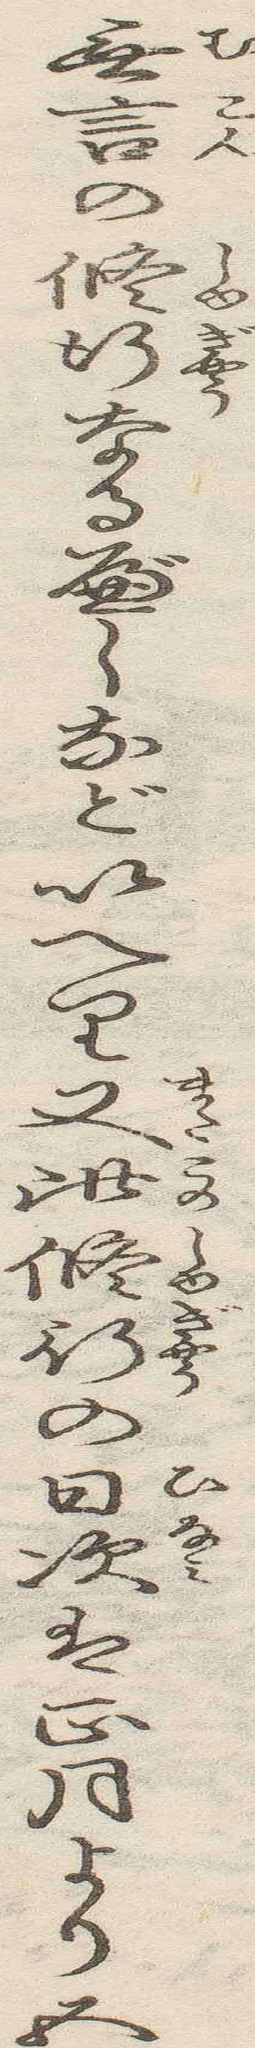無言の修行なるべしなどいへり又此修行の日次は正月より五
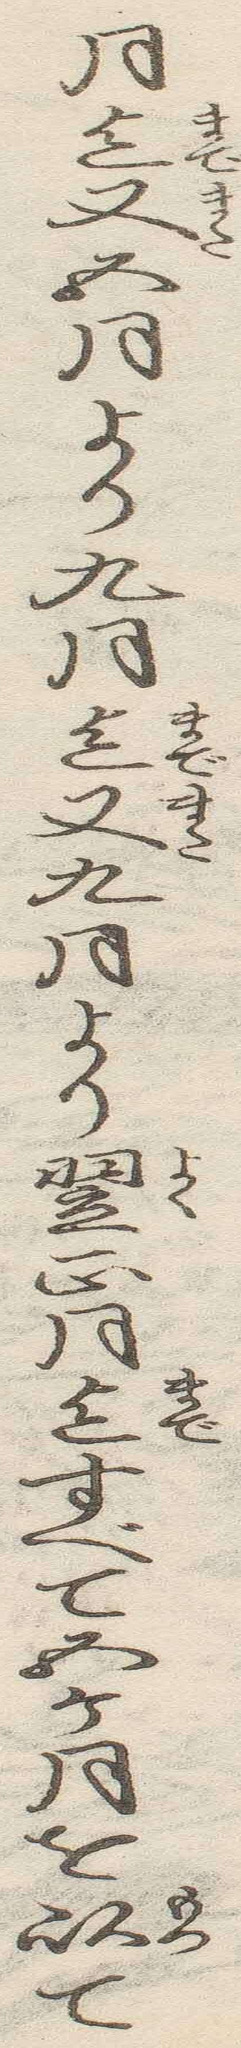月迄又五月より九月迄又九月より翌正月迄すべて五ヶ月を以て
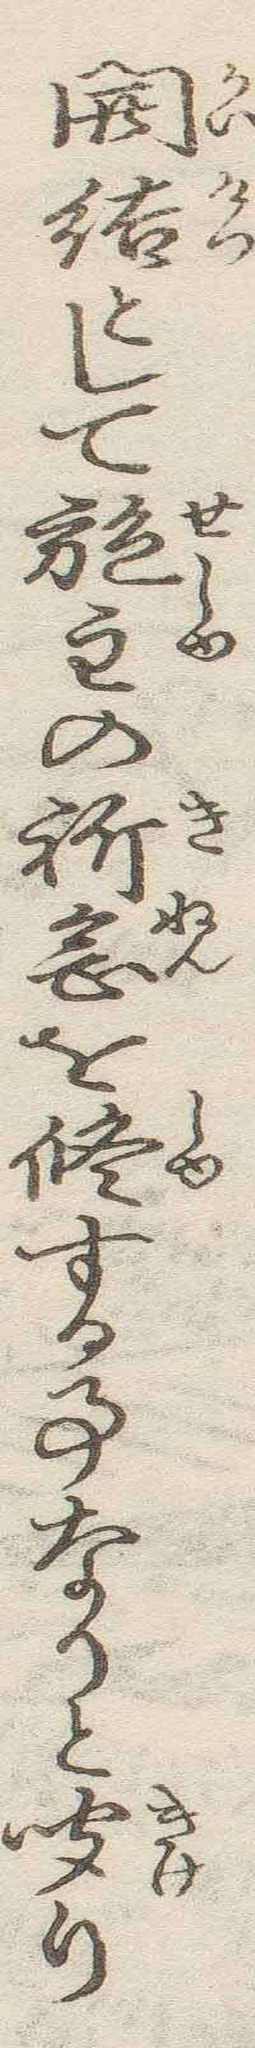開結として施主の祈念を修する事なりと聞り
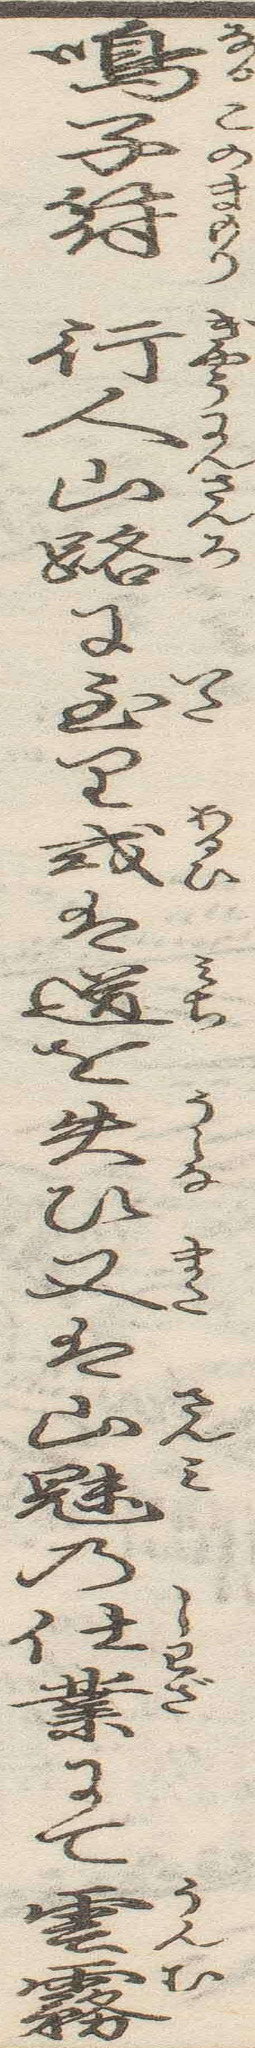鳴子符行人山路に至り或は道を失ひ又は三魅の仕業にて雲霧
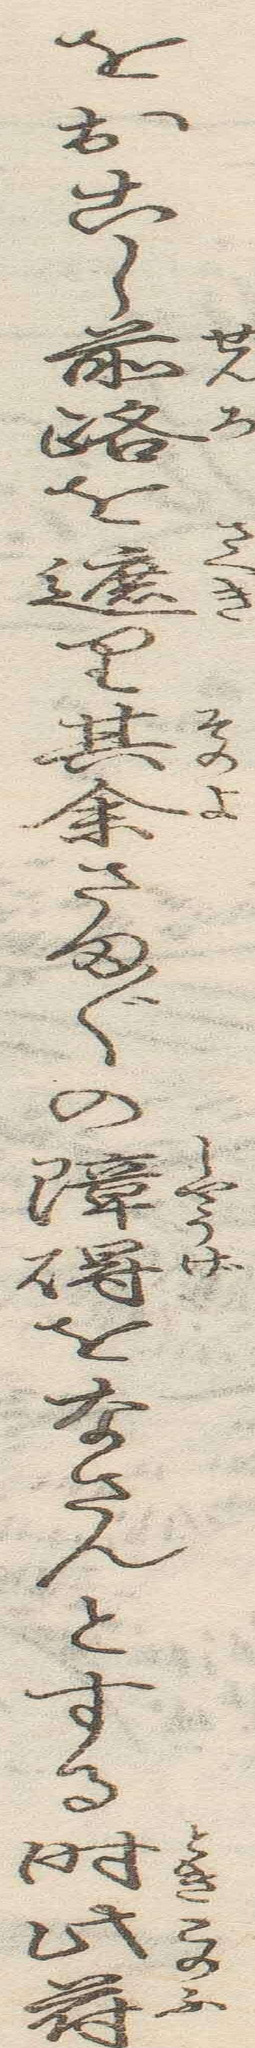をおこし前路を遮り其余さま〴〵の障碍をなさんとする时此符
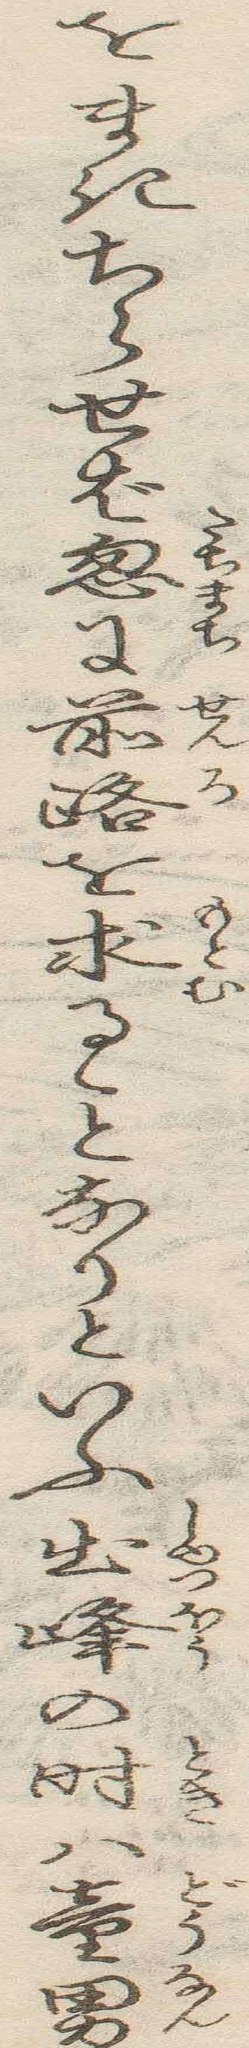をまきちらせば忽に前路を求ることなりといふ出峰の时は童男
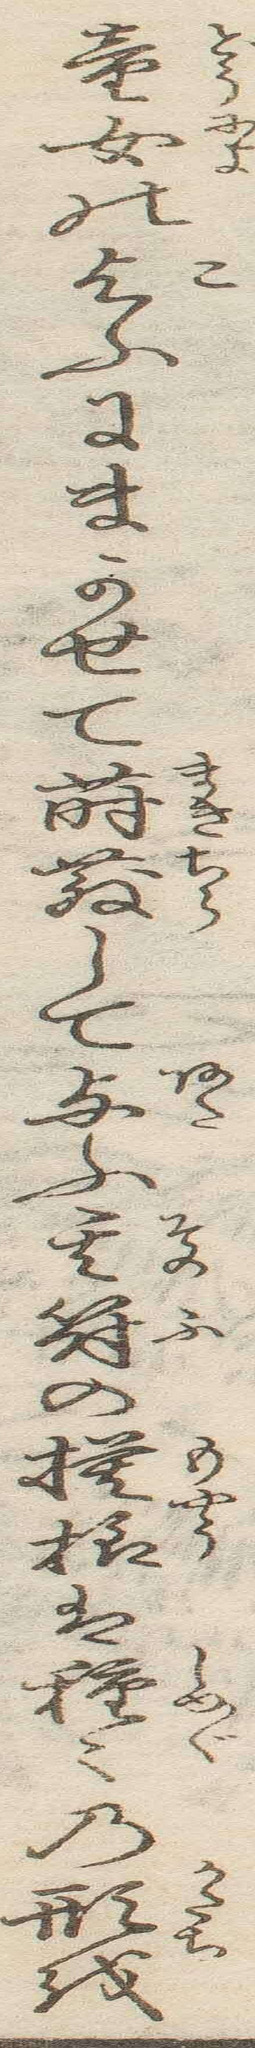童女の乞ふにまかせて蒔散して与ふ其符の模様は種〻の形を
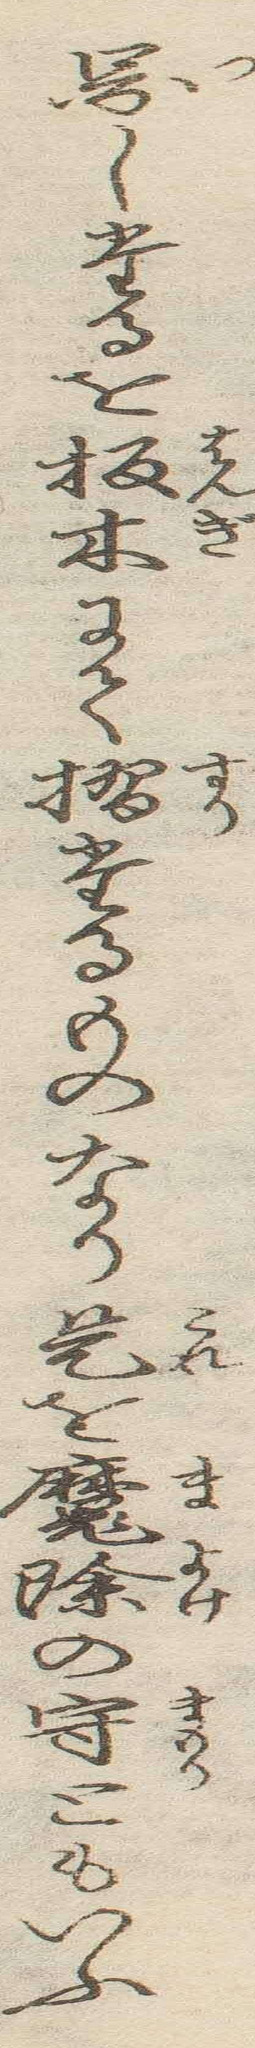圖したるを板木にて摺たるものなり是を魔除の守ともいふ
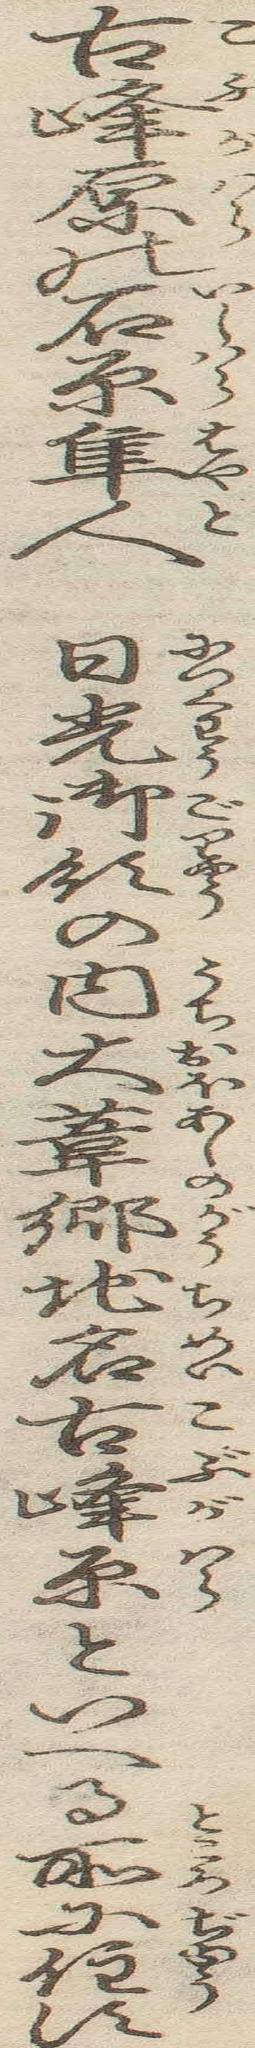古峰原の石原隼人日光御領の内大葦郷地名古峰原といへる所に住す

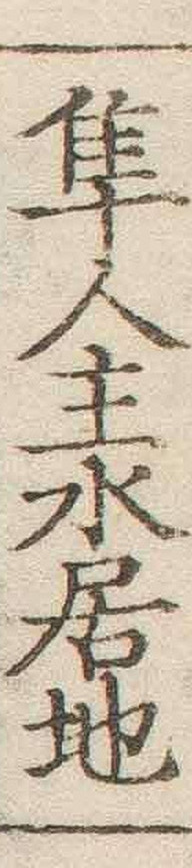隼人主水居地
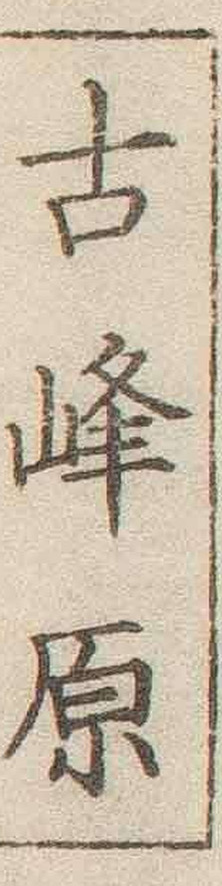古峰原

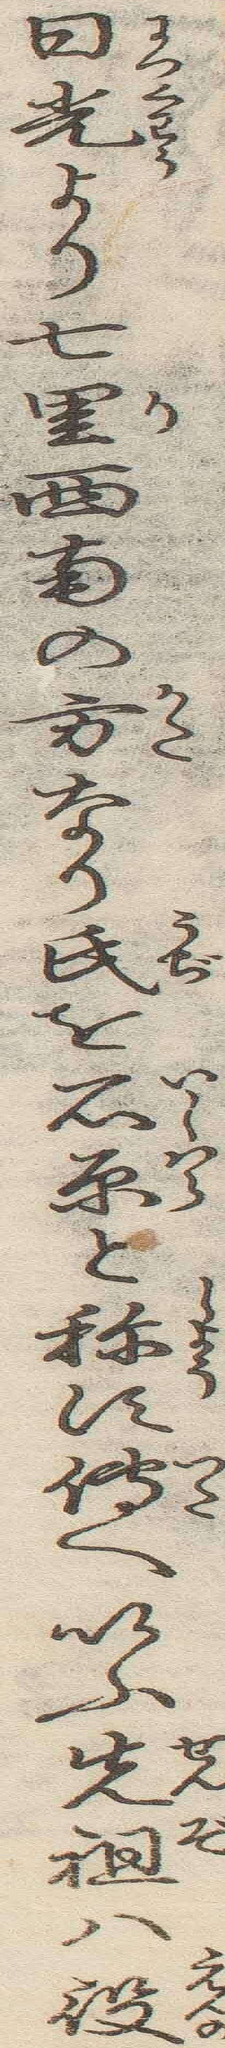日光より七里西南の方なり氏を石原と称す傳へいふ先祖は役
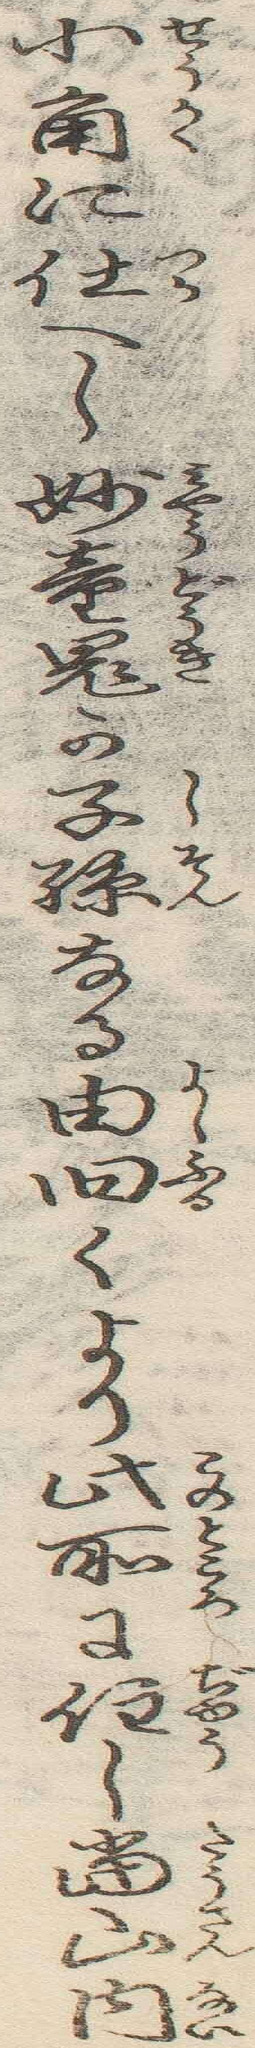小角に仕へし妙童鬼か子孫なる由旧くより此所に住し當山内
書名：日光山志
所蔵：東京学芸大学附属図書館 国文学研究資料館
